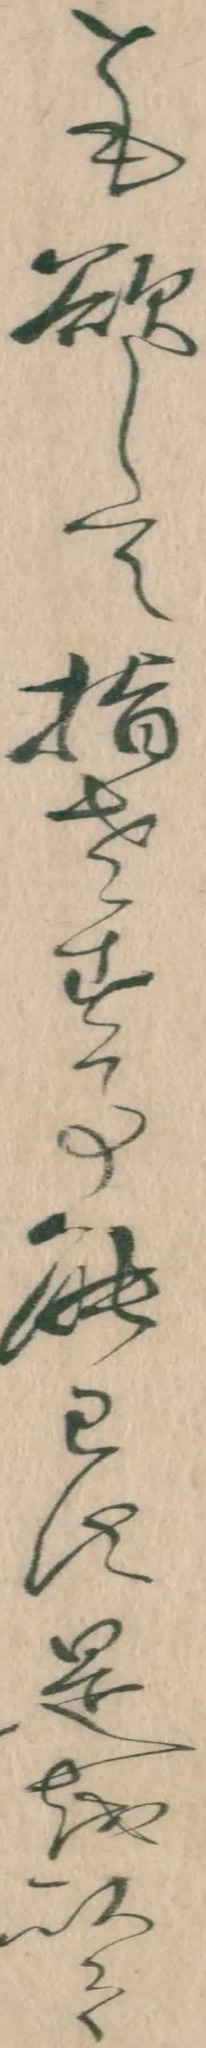とも欲して指さす事能わす是を以て
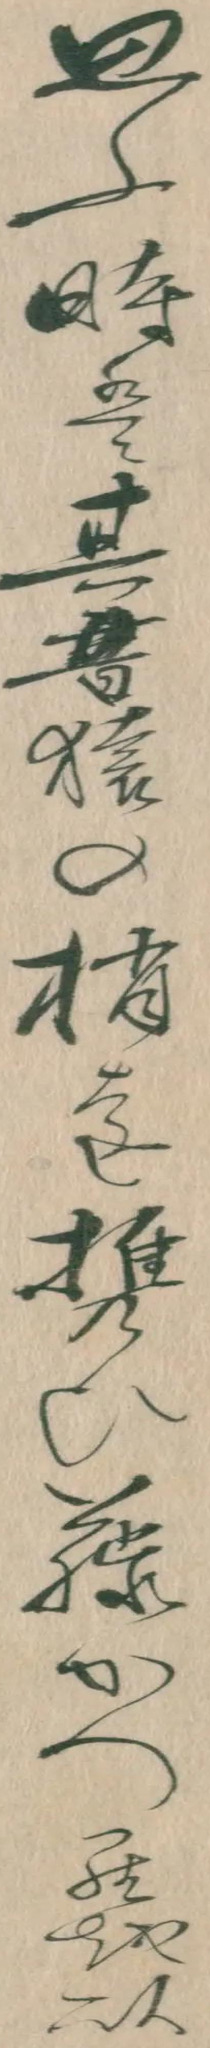思ふ時は其昔猿の梢を携ひ藤かつらを以
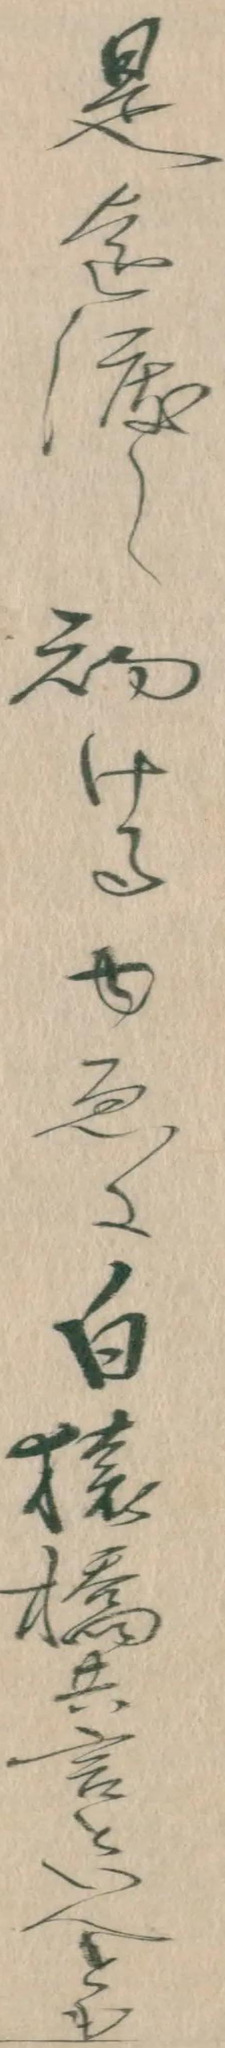是を渡し初けるゆゑに白猿橋共言といへとも
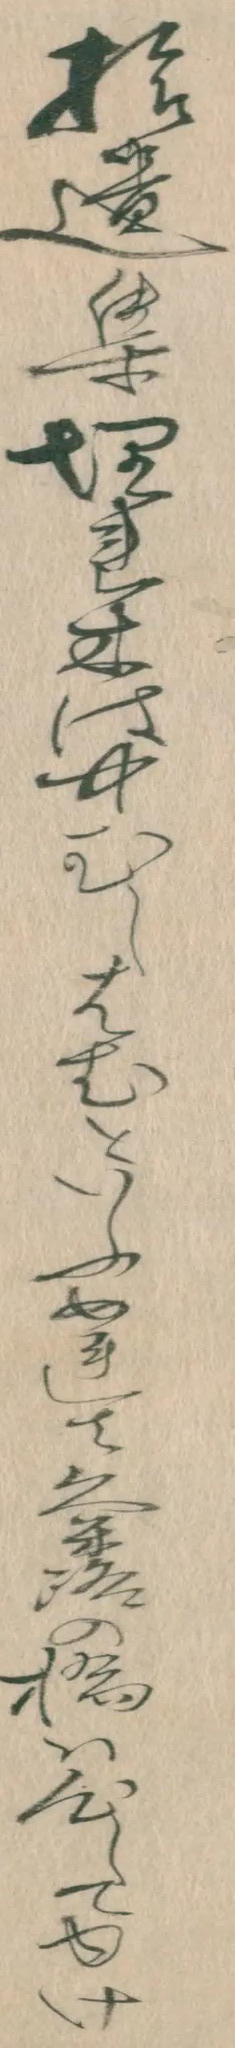拾遺集埋れ木は中むしはむといふめれは久米路の橋は心してゆけ
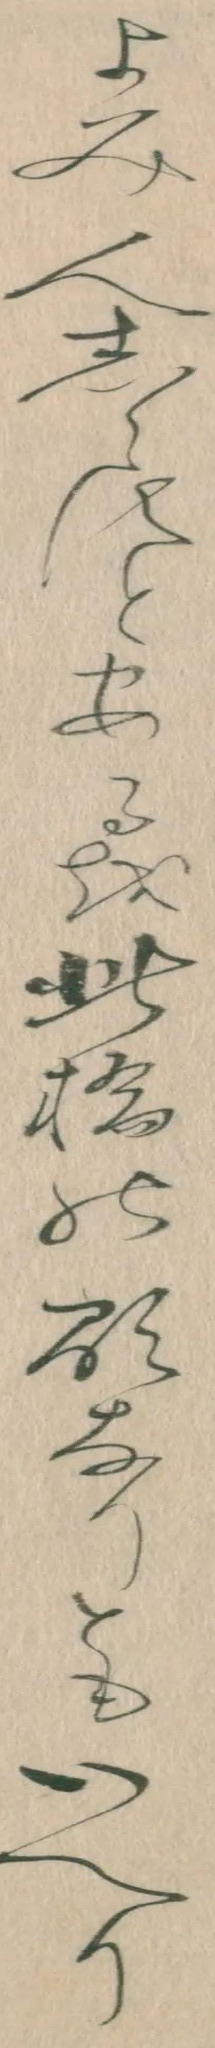よみ人しらすとあるを此橋の歌なりともいへり
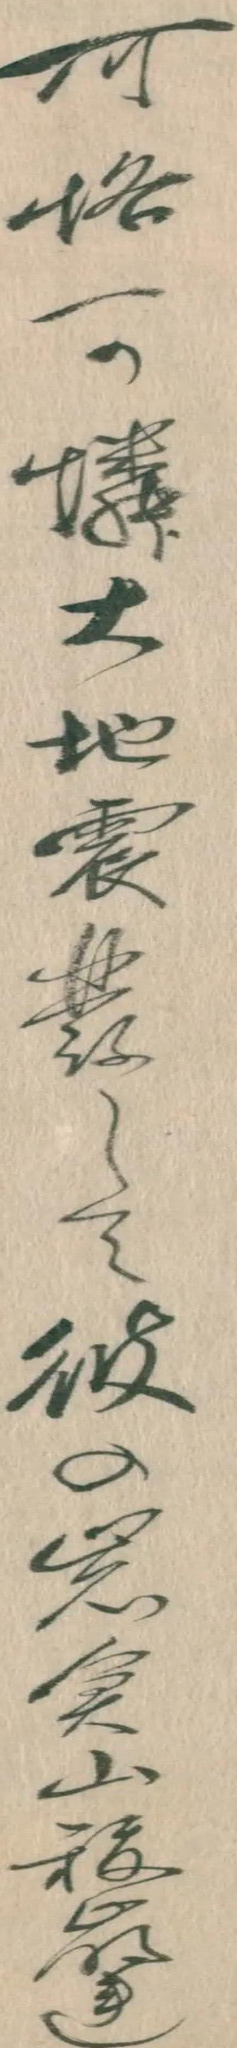可悟可憐大地震発して彼の岩倉山抜崩れ
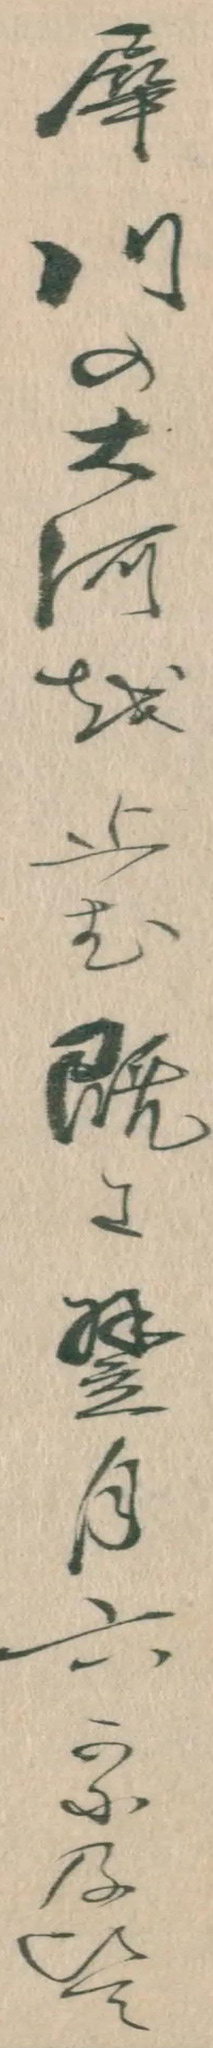犀川の大河を止む既に翌月六かに及ひて
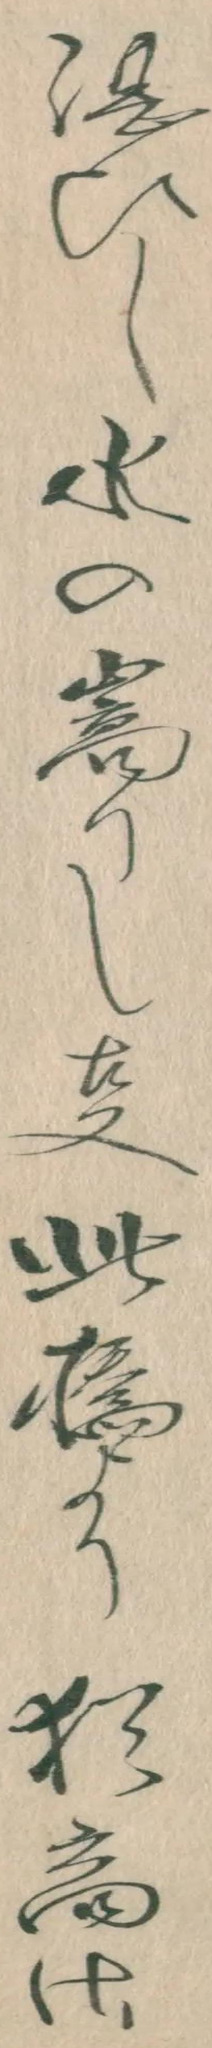湛ひし水の嵩りし事此橋より猶高さ
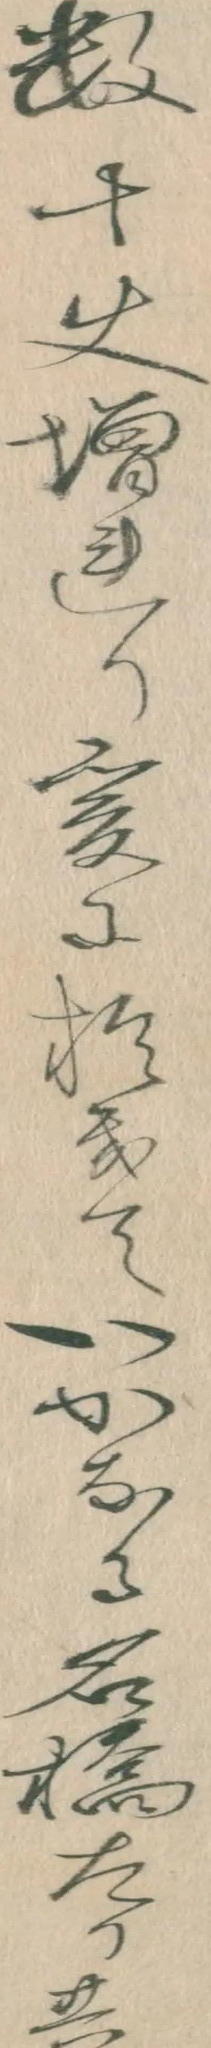数十丈増れり爰におきていかなる名橋たり共
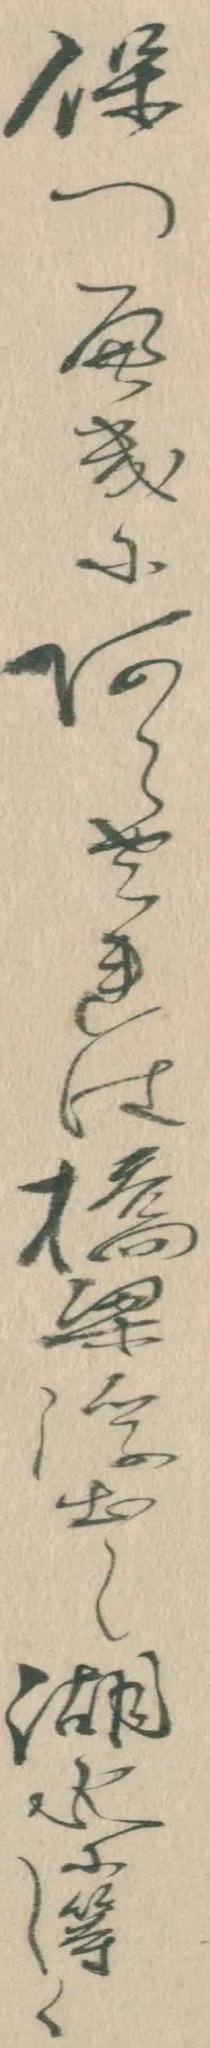保つへきにあらされは橋梁浮出し湖水に等しく
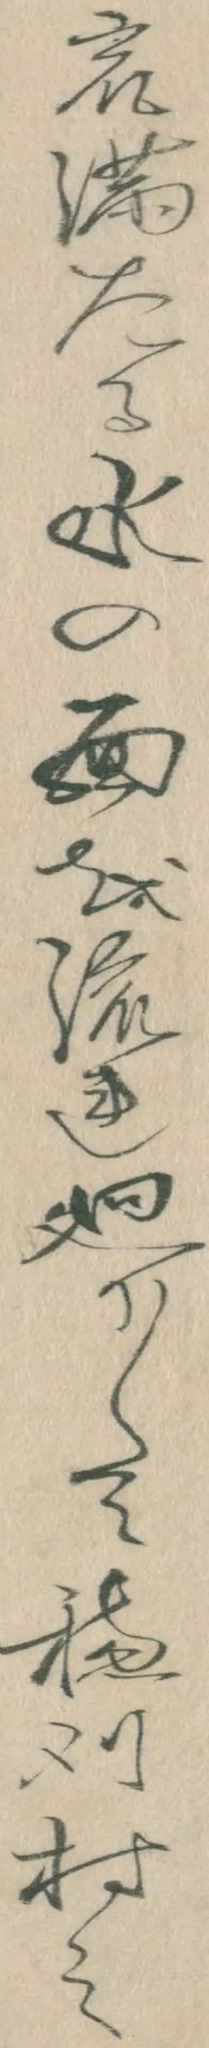充満たる水の面を流れ廻り〳〵て穂刈村之

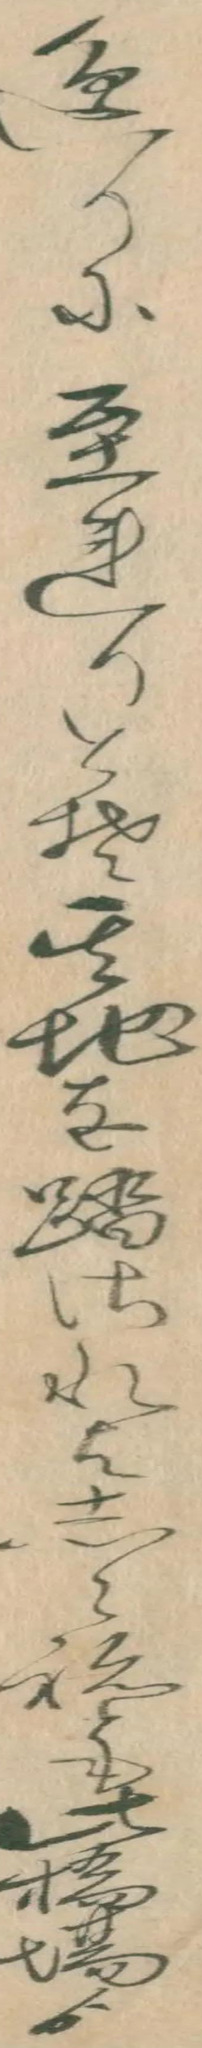辺りに至れりとそ其地を踏されはしらねとも此の橋場ゟ
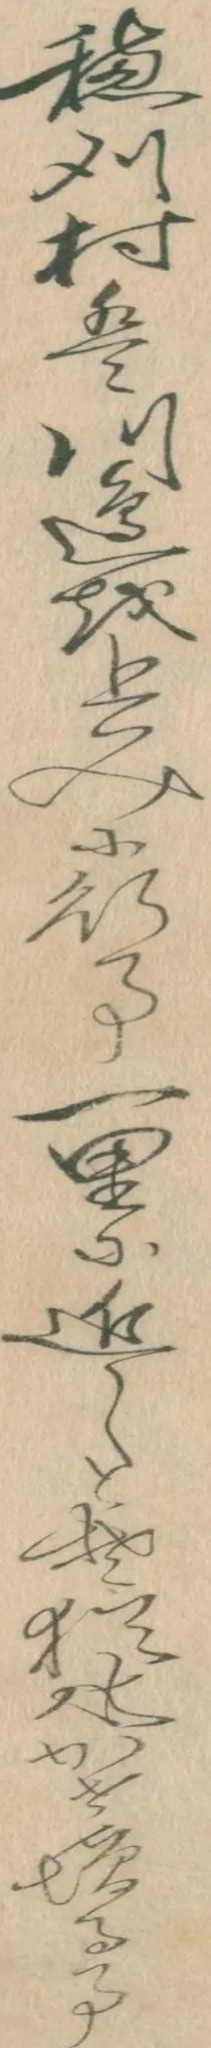穂刈村は川辺を上みに行事一里に近しとそ猶水かさ増る事
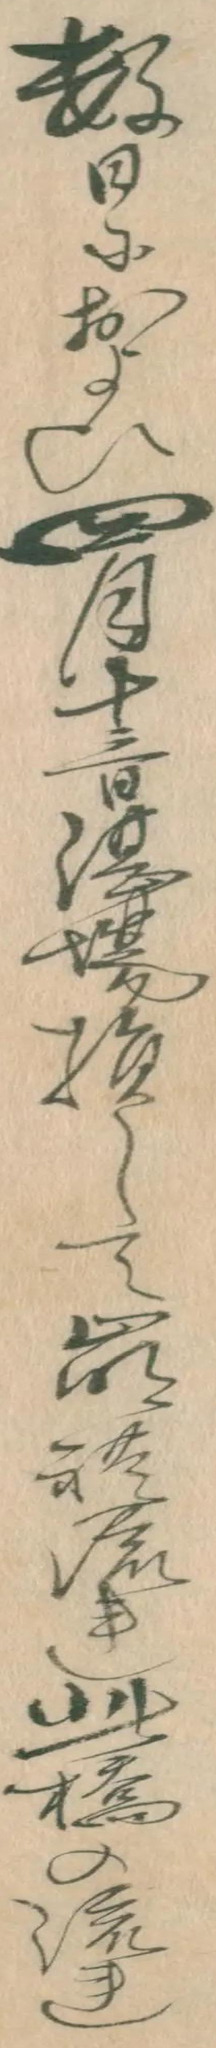数日におよひ四月十三日湛場損して崩れ流れ此橋の流れ
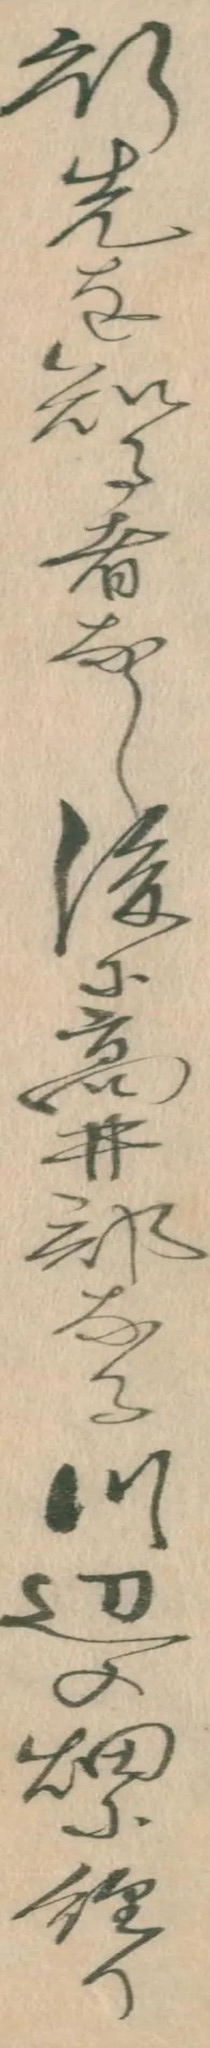行先を知る者なし後に高井郡なる川辺の畑に経り
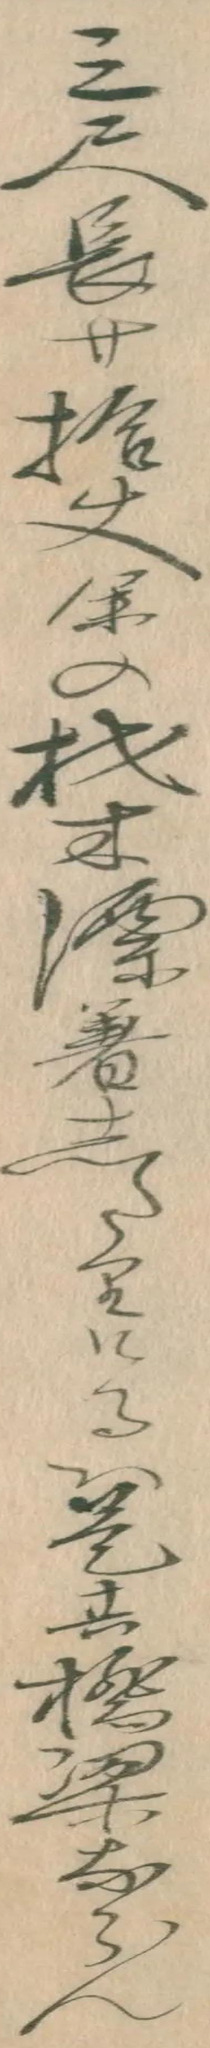三尺長サ拾丈余の材木漂着したりけるは是其橋梁ならん
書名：俗語之種. [6]
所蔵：国立国会図書館 National Diet Library, JAPAN
